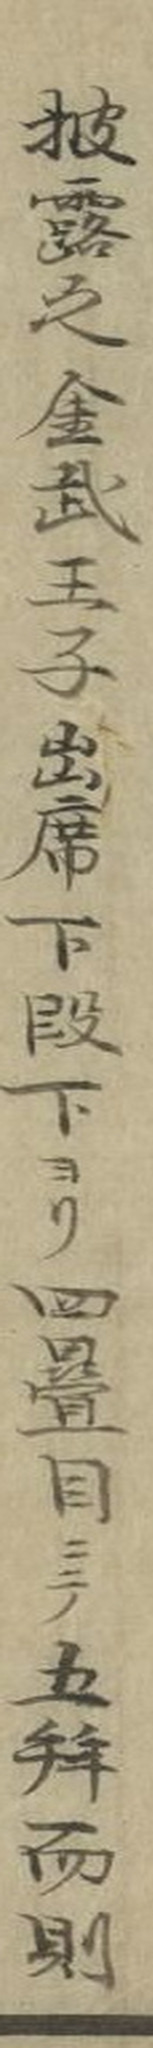披露之金武王子出席下段下ョㇼ四畳目ニテ五拝而則
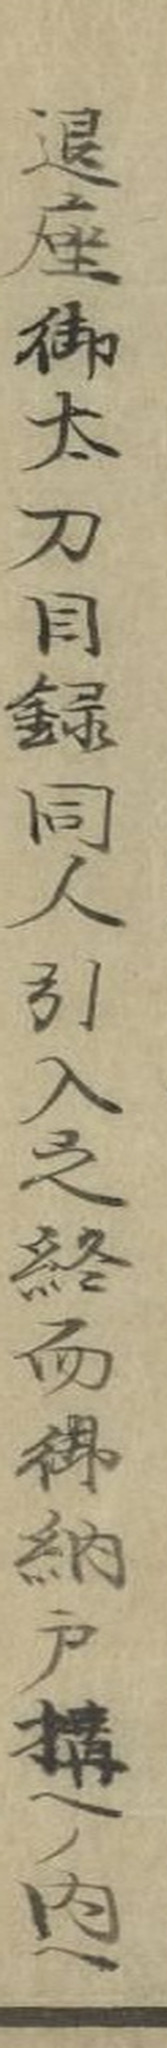退座御太刀目録同人引入之終而御納戸構へノ内へ
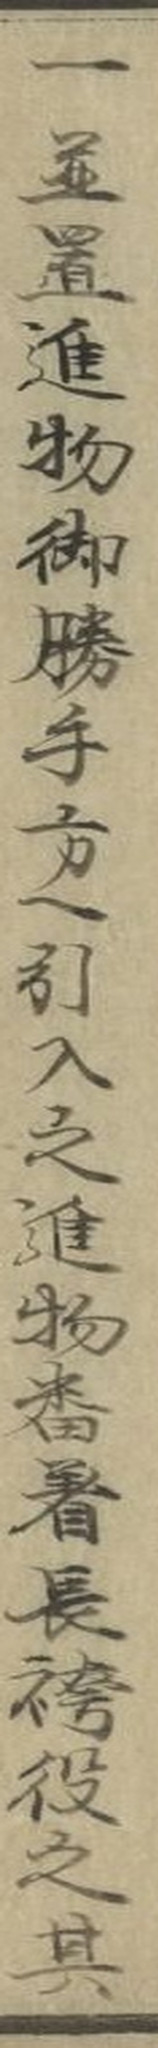一並置進物御勝手方へ引入之進物番着長袴役之其
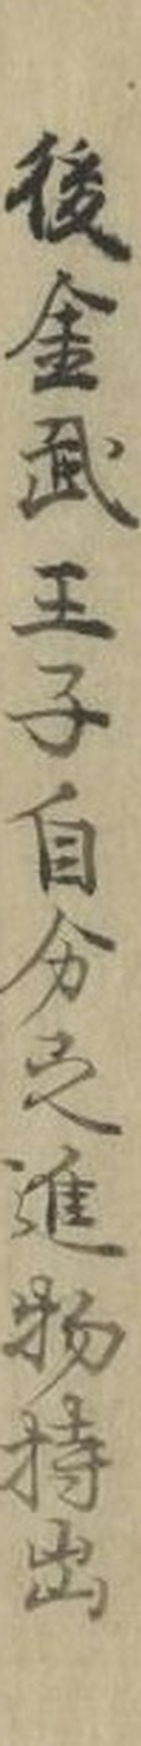後金武王子自分之進物持出
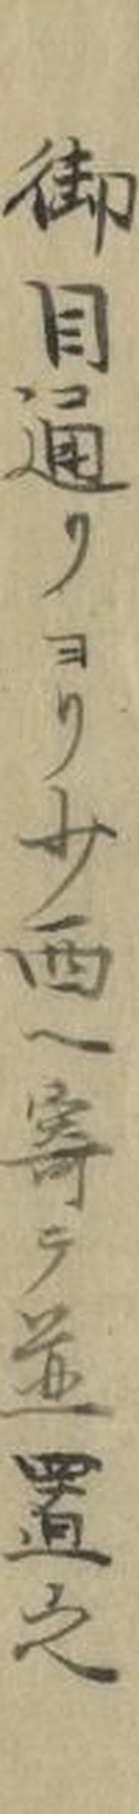御目通りョㇼ少西へ寄テ並置之
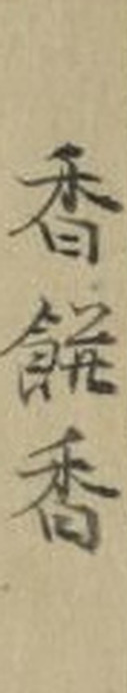香餅香五箱
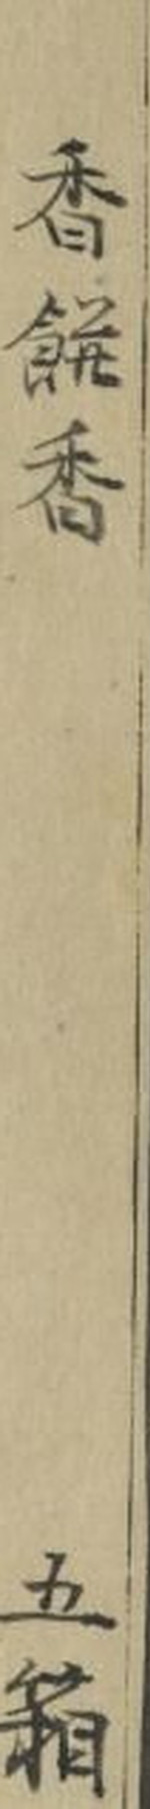香餅香五箱
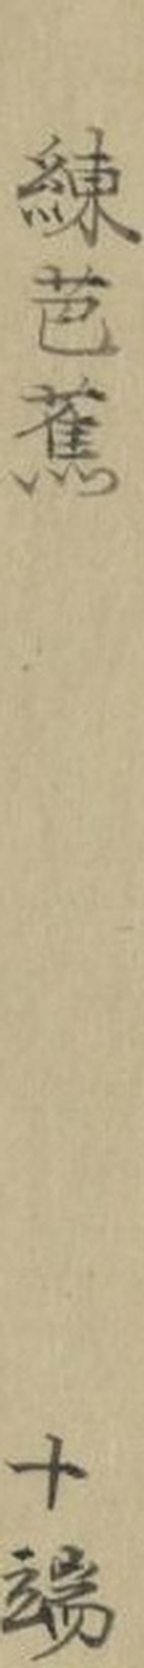練芭蕉十端
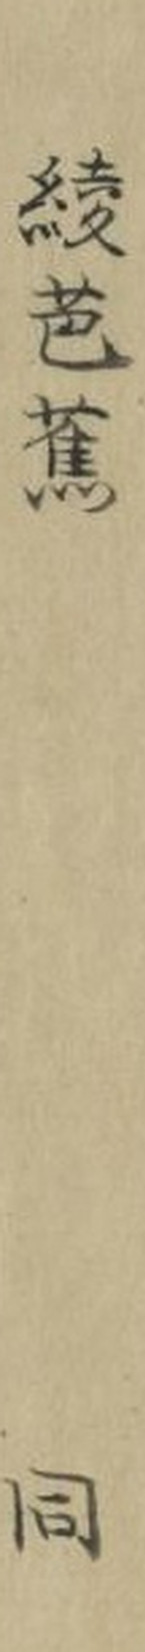綾芭蕉同
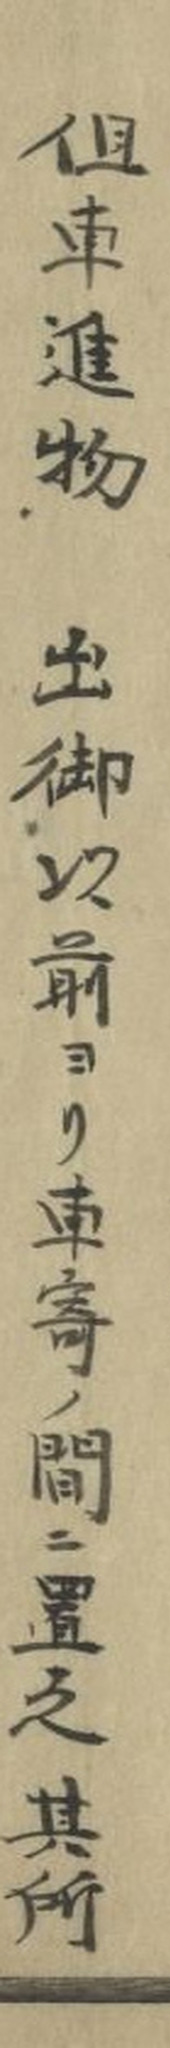但車進物出御以前ョㇼ車寄ノ間二置之其所
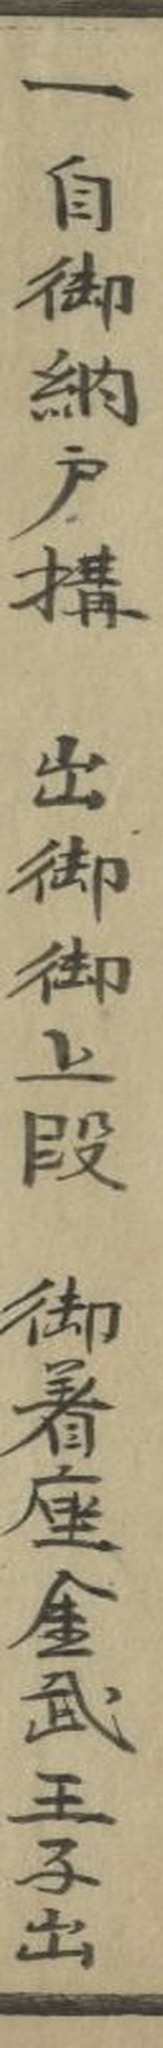一自御納戸様出御御上段御着座金武王子出
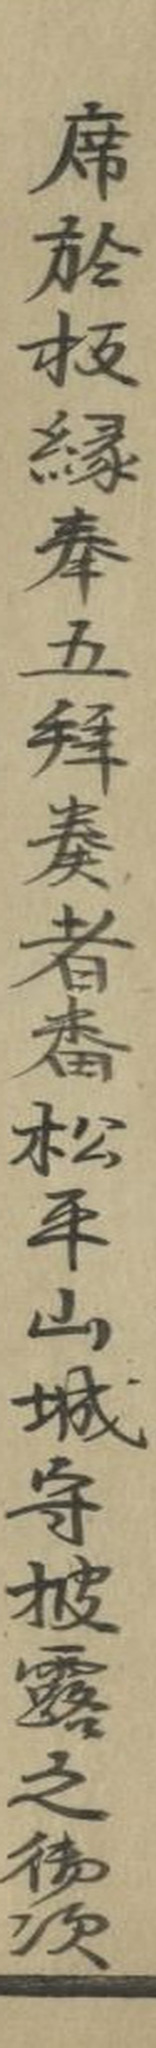席於板縁奉五拝奏者番松平山城守披露之御次
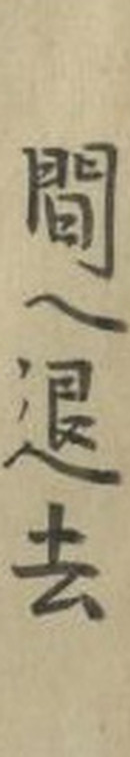間へ退去
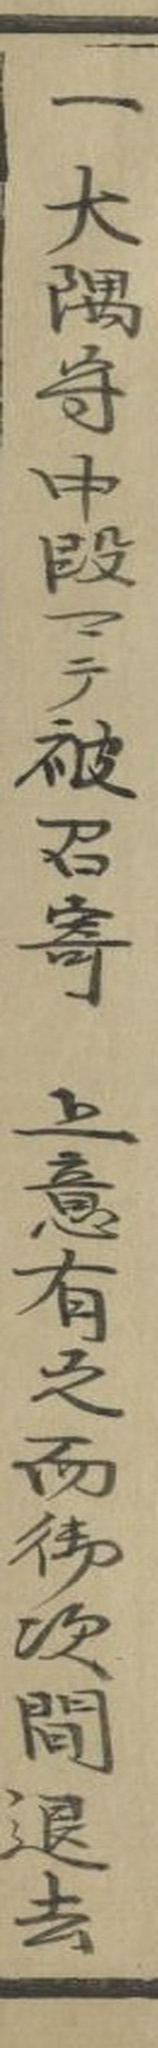一大隅守中段マテ被召寄上意有之而御次間退去

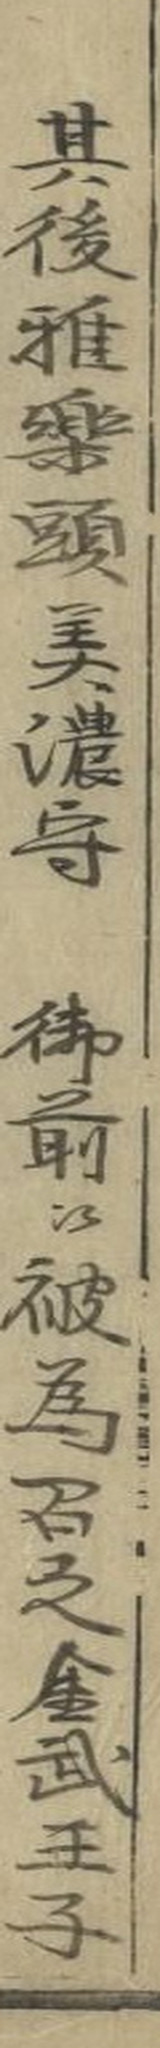其後雅楽頭美濃守御前え被為召之金武王子
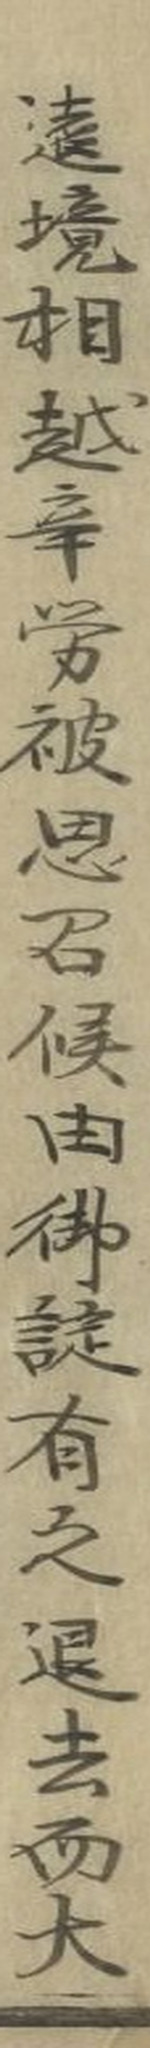遠境相越辛労被思召候由御諚有之退去而大
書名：琉球往来（下）
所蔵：University of the Ryukyus Library
